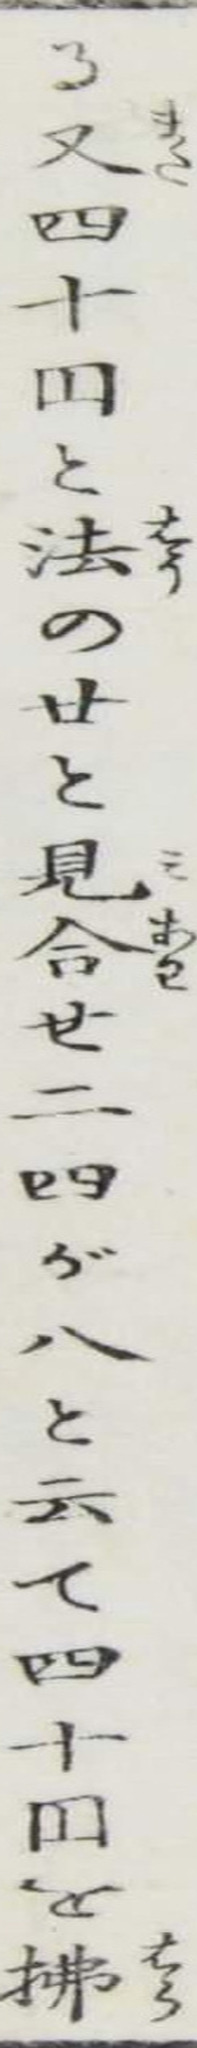る又四十円と法の廿と見合せ二四が八と云て四十円を払
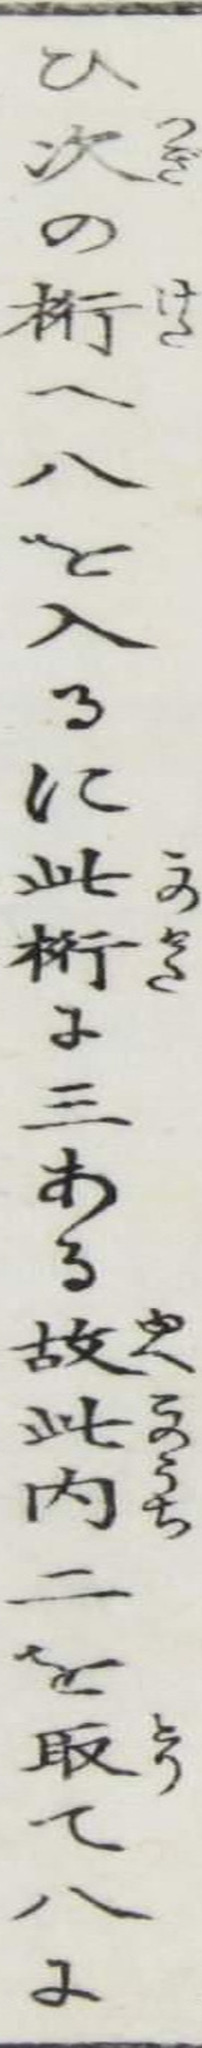ひ次の桁へ八を入るに此桁に三ある故此内二を取て八に
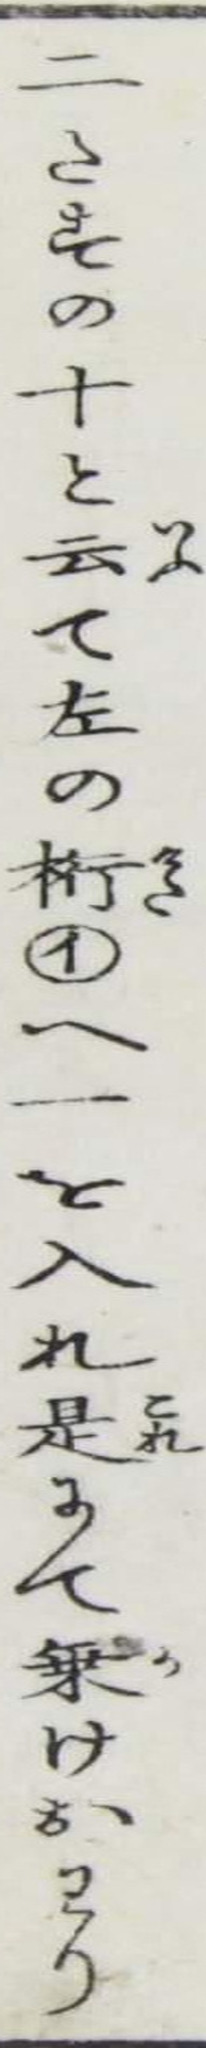二たすの十と云て左の桁㋑へ一を入れ是にて乗けおわり
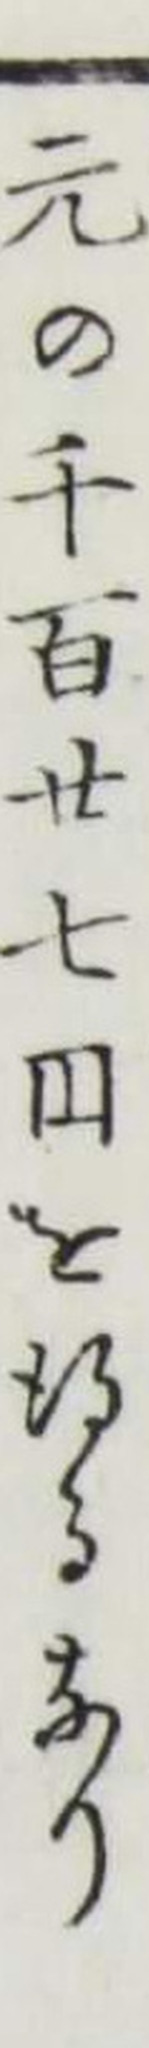元の千百廿七円を得るなり
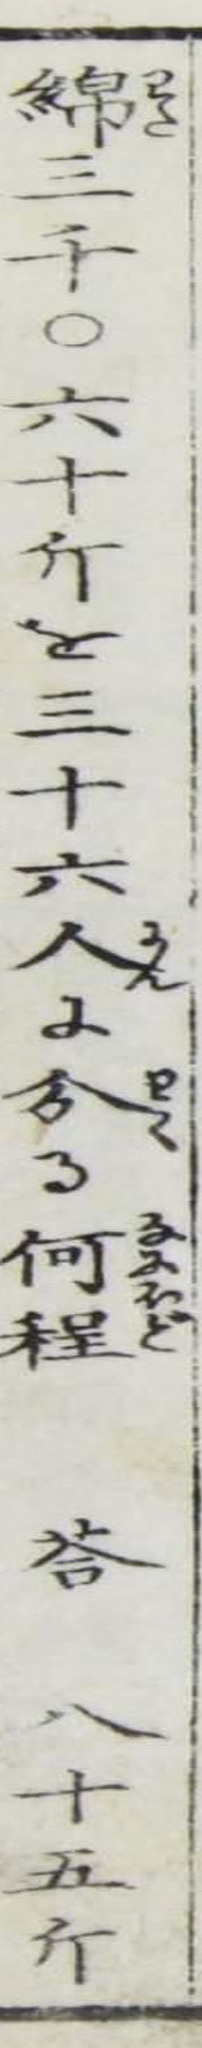綿三千〇六十斤を三十六人に分る何程答八十五斤
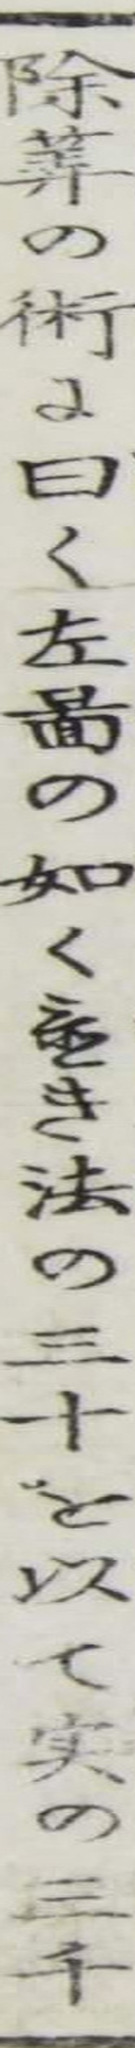除算の術に曰く左図の如く置き法の三十を以て実の三千

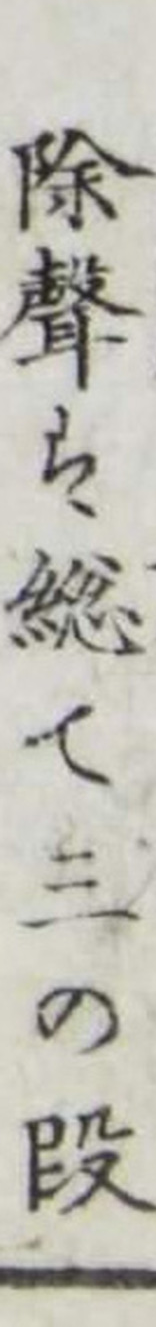除声は総て三の段
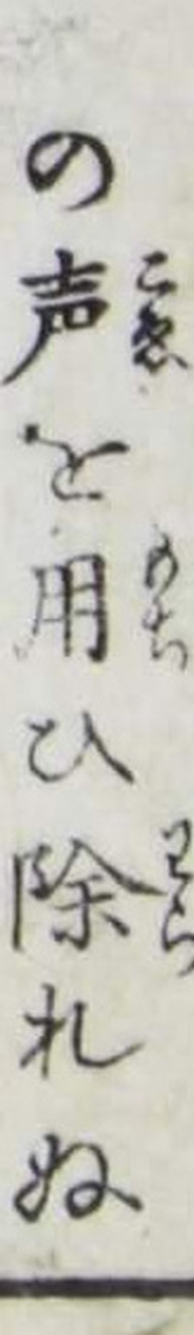の声を用ひ除れぬ
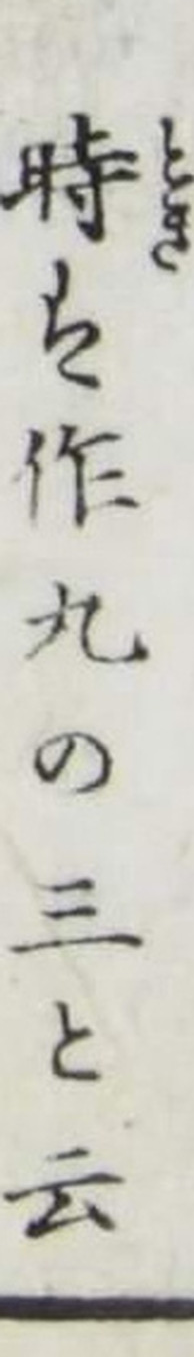時は作九の三と云
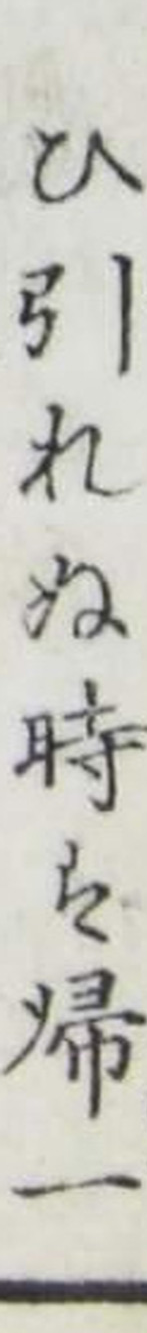ひ引れぬ時は帰一
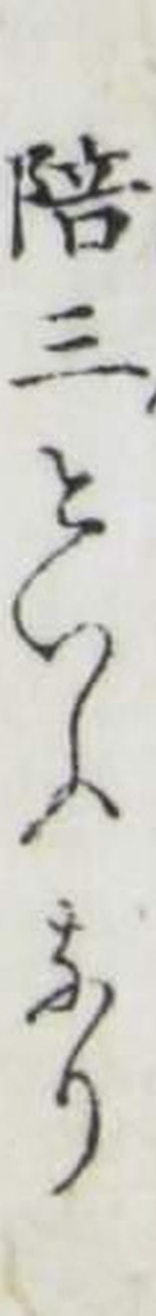陪三といふなり
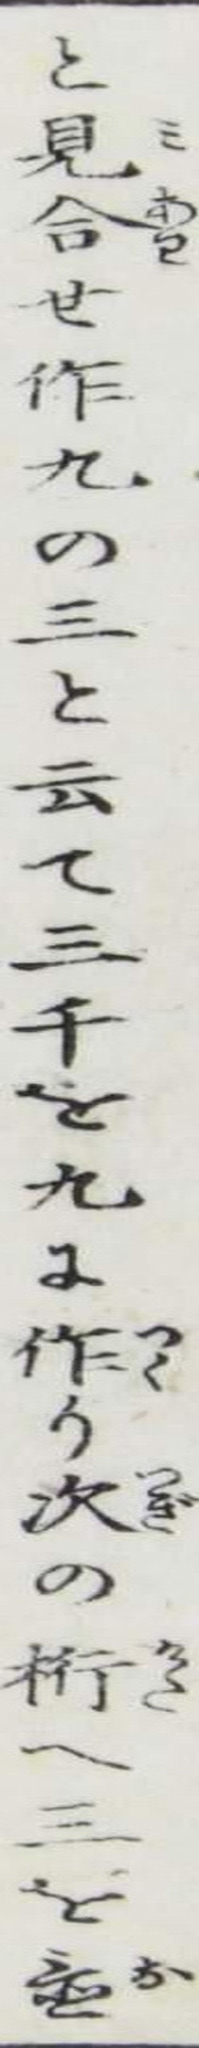と見合せ作九の三と云て三千を九に作り次の桁へ三を置
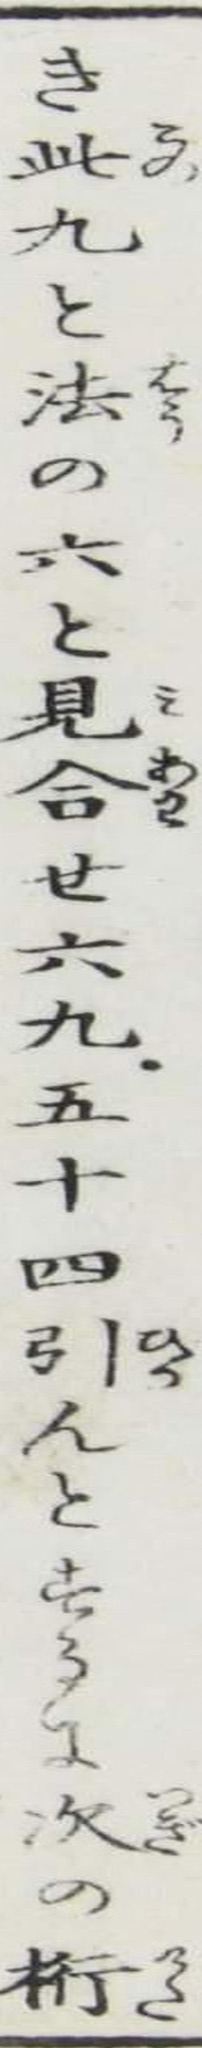き此九と法の六と見合せ六九．五十四引んとするに次の桁
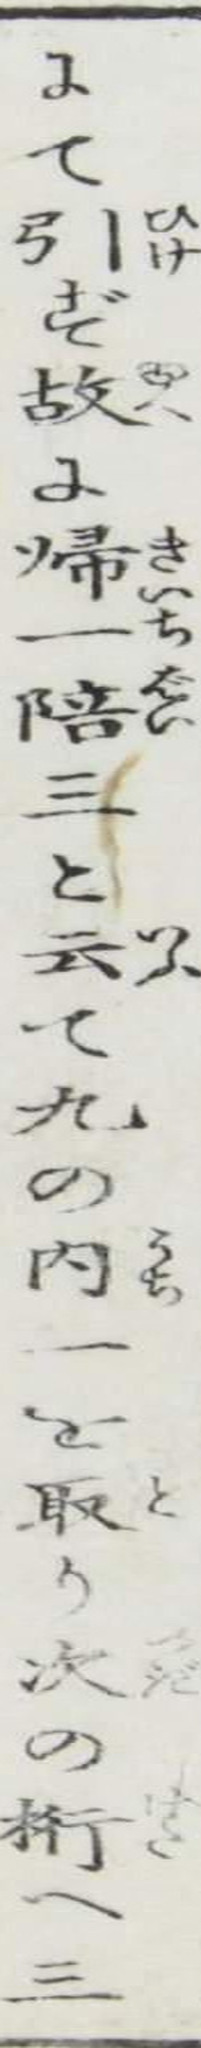にて引ず故に帰一陪三と云て九の内一を取り次の桁へ三
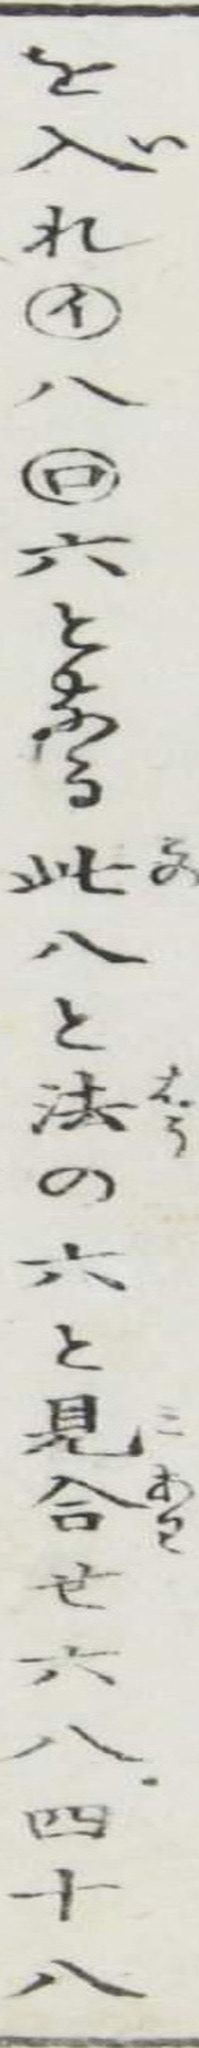を入れ㋑八㋺六となる此八と法の六と見合せ六八．四十八
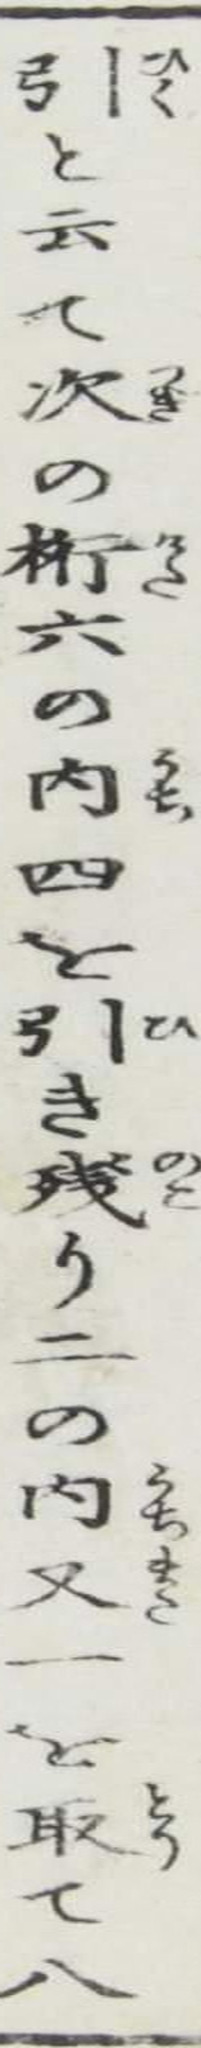引と云て次の桁六の内四を引き残り二の内又一を取て八
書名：明治小學塵劫記 卷1
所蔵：東京学芸大学教育コンテンツアーカイブ
